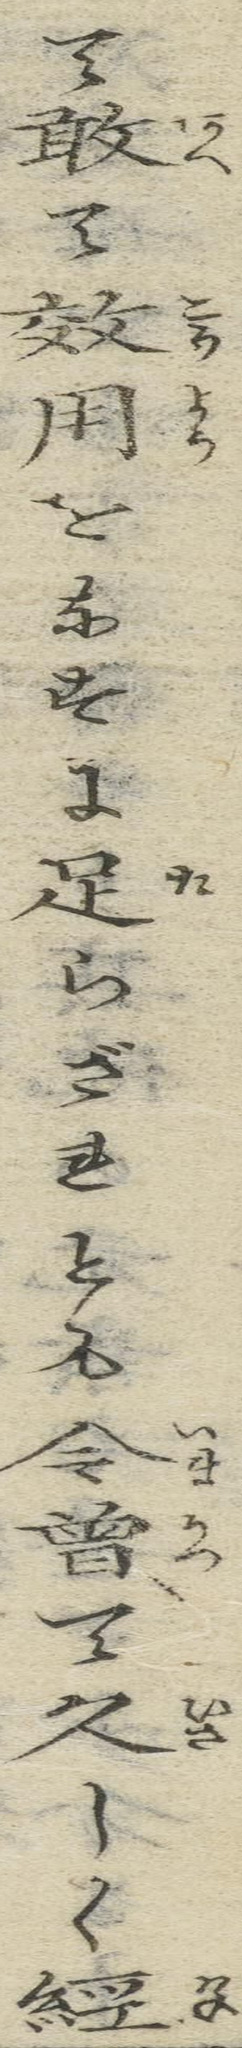て敢て効用をなすに足らざれとも今曾て久しく経
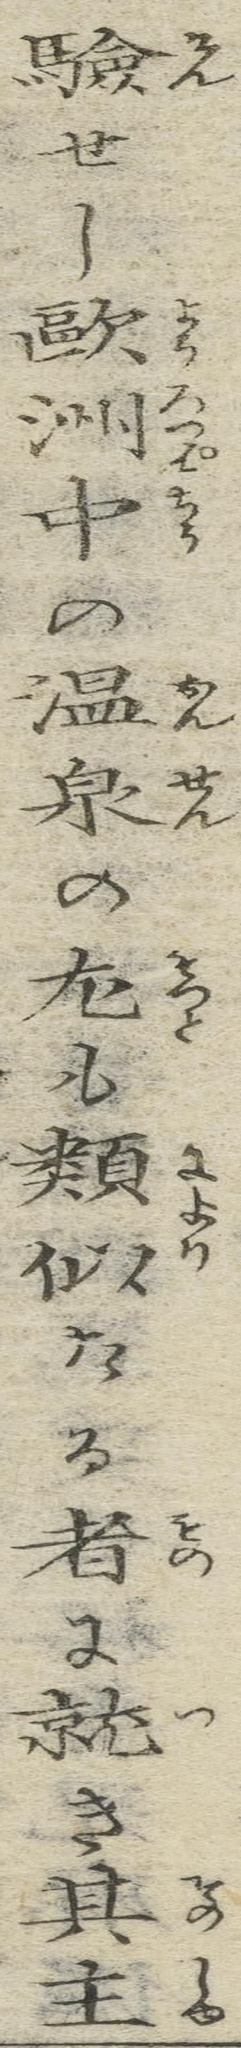験せし欧洲中の温泉の尤も類似なる者に就き其主
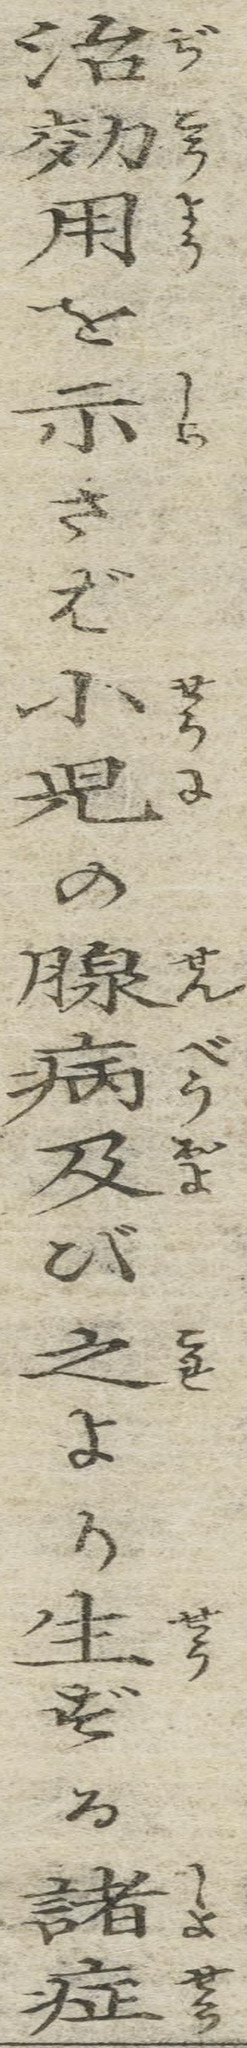治効用を示さば小児の腺病及び之より生ずる諸症
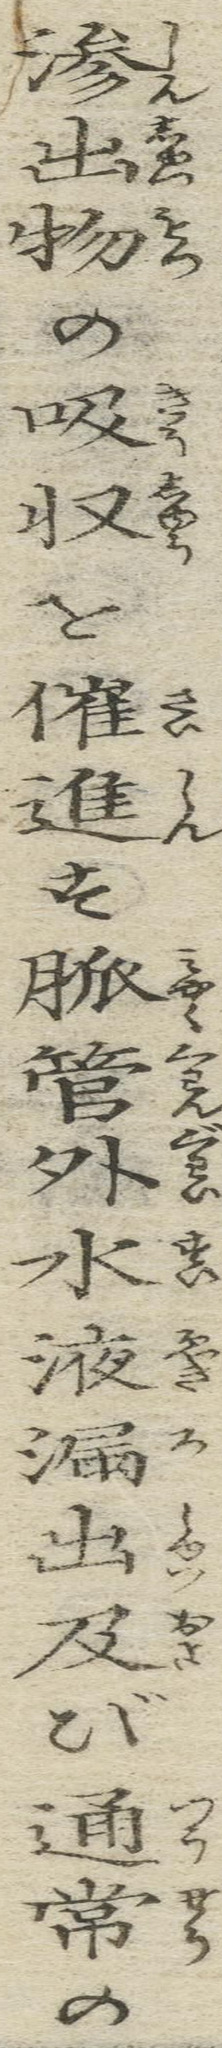滲出物の吸収を催進す脈管外水液漏出及び通常の
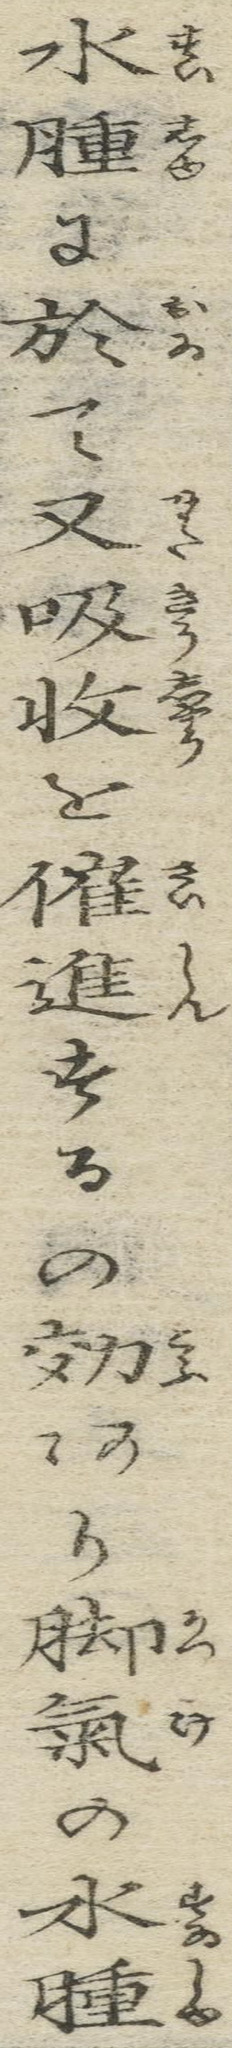水腫に於て又吸収を催進するの効あり脚気の水腫
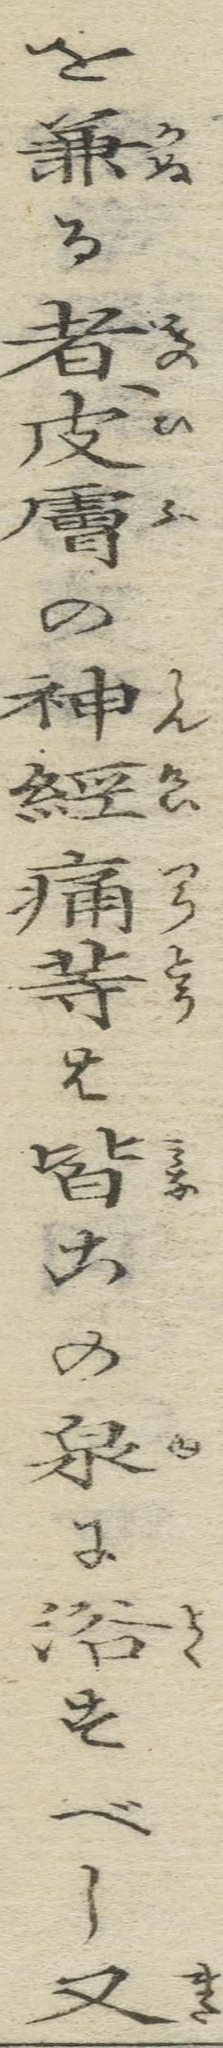を兼る者、皮膚の神経痛等は皆この泉に浴すべし又
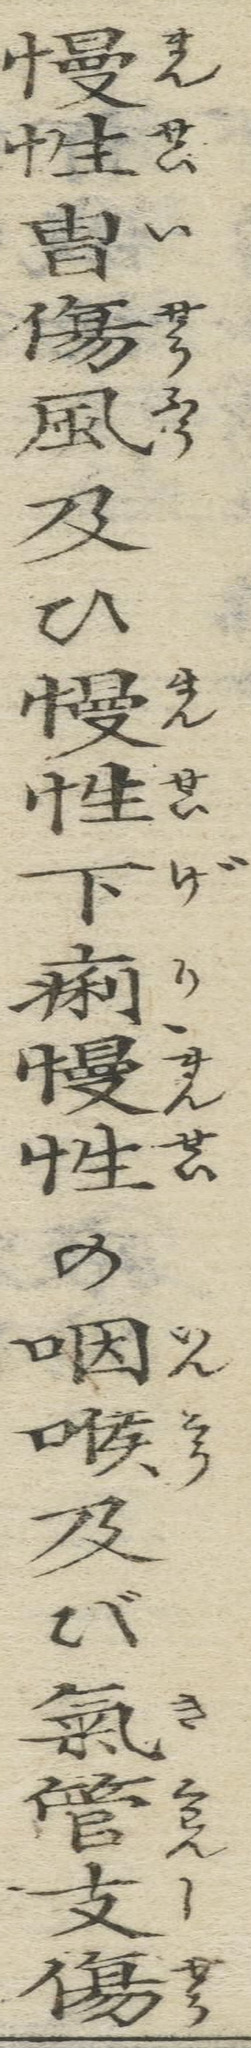慢性胃傷風及ひ慢性下痢、慢性の咽喉及び気管支傷
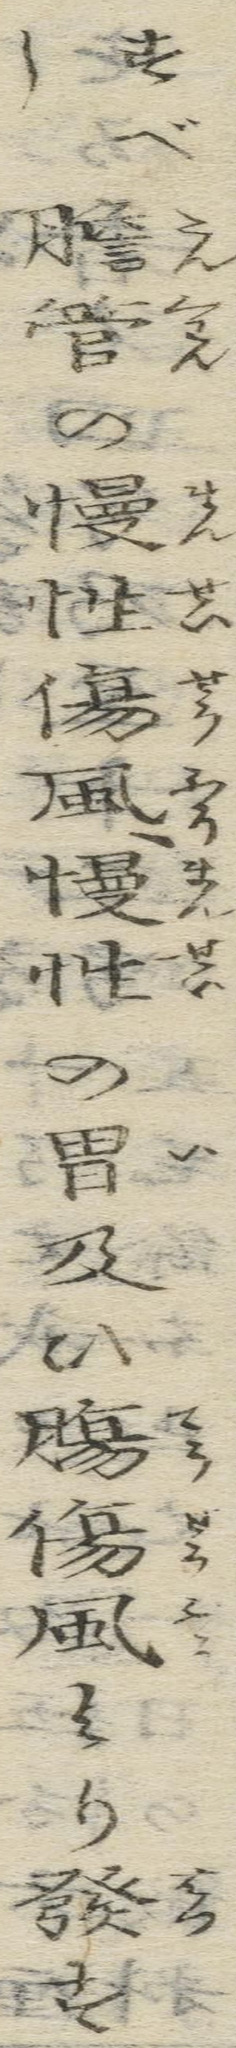すべし胆管の慢性傷風、慢性の胃及び腸傷風より発す
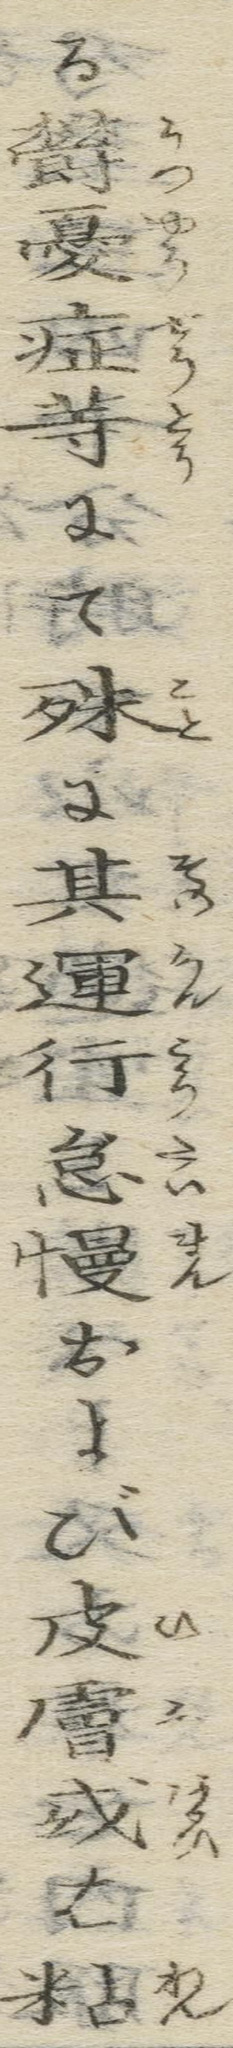る欝憂症等にて殊に其運行怠慢および皮膚或は粘
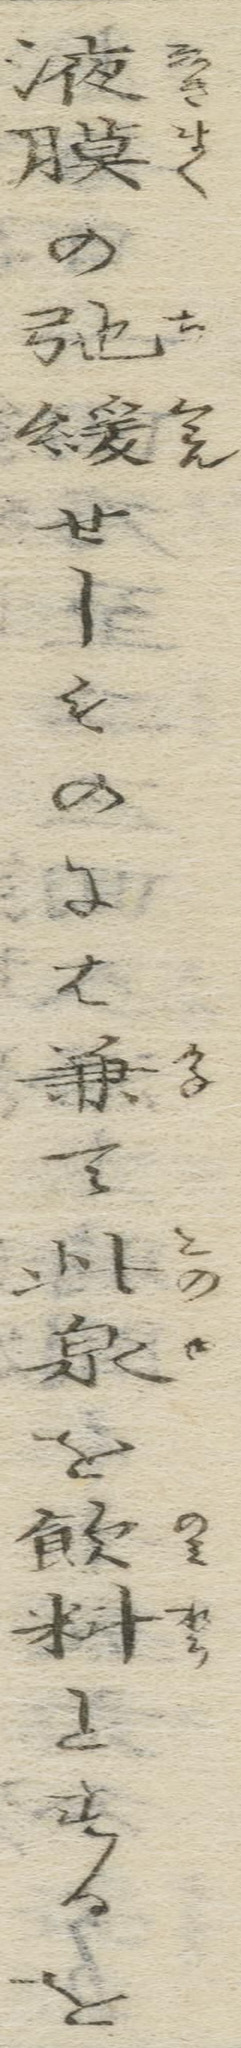液膜の弛緩せしものには兼て此泉を飲料とするを
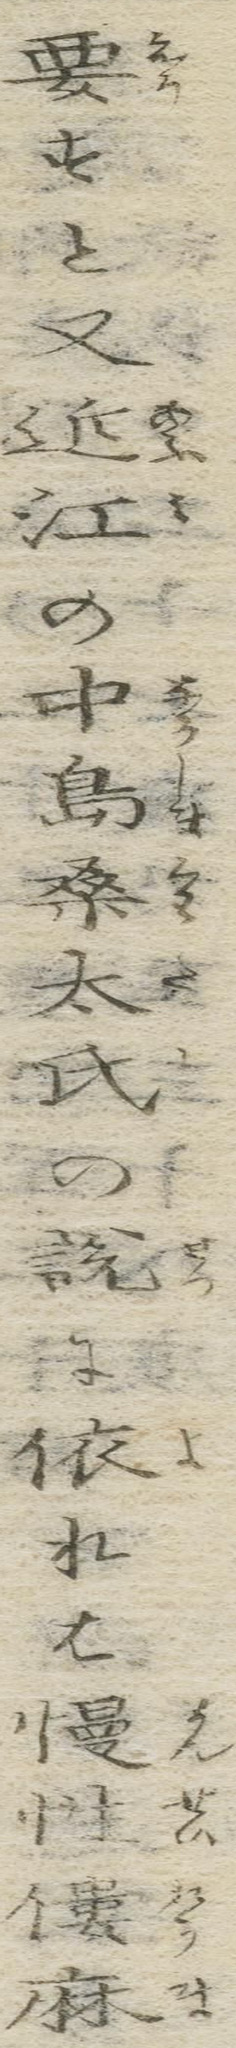要すと又近江の中島桑太氏の説に依れは慢性僂麻
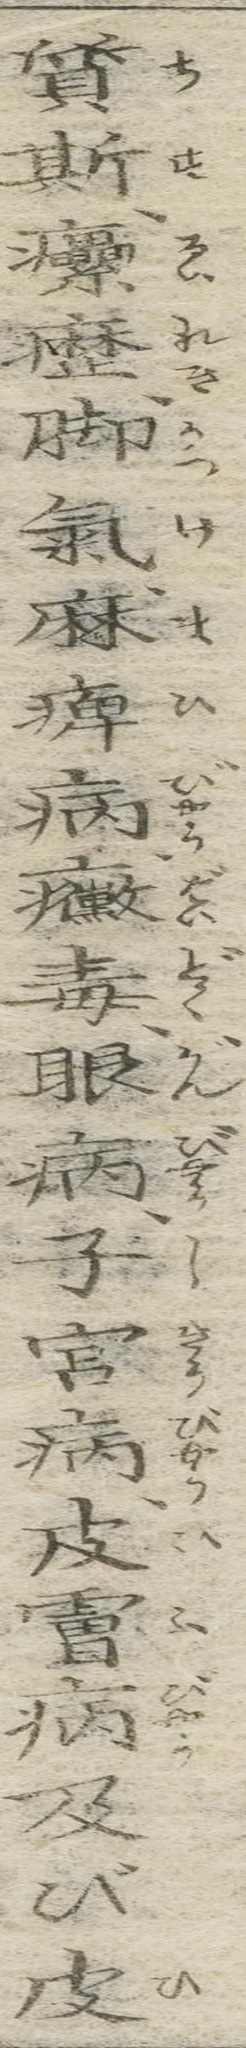質斯、瘰癧、脚気、麻痺病、黴毒、眼病、子宮病、皮膚病及び皮
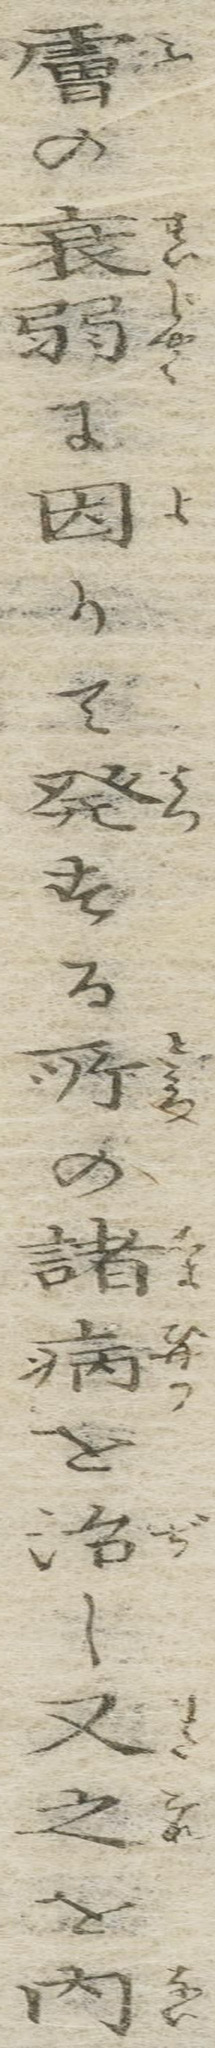膚の衰弱に因りて発する所の諸病を治し又之を内
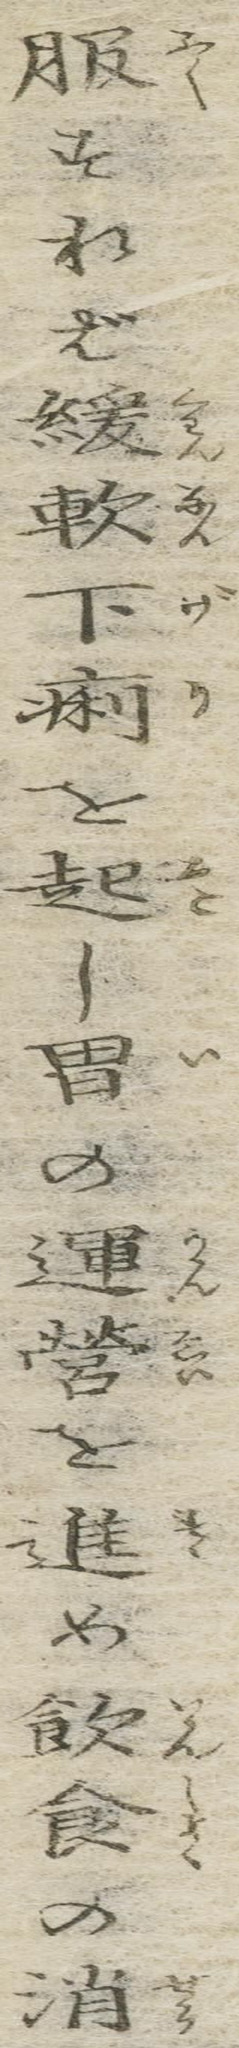服すれば緩軟下痢を起し胃の運営を進め飲食の消
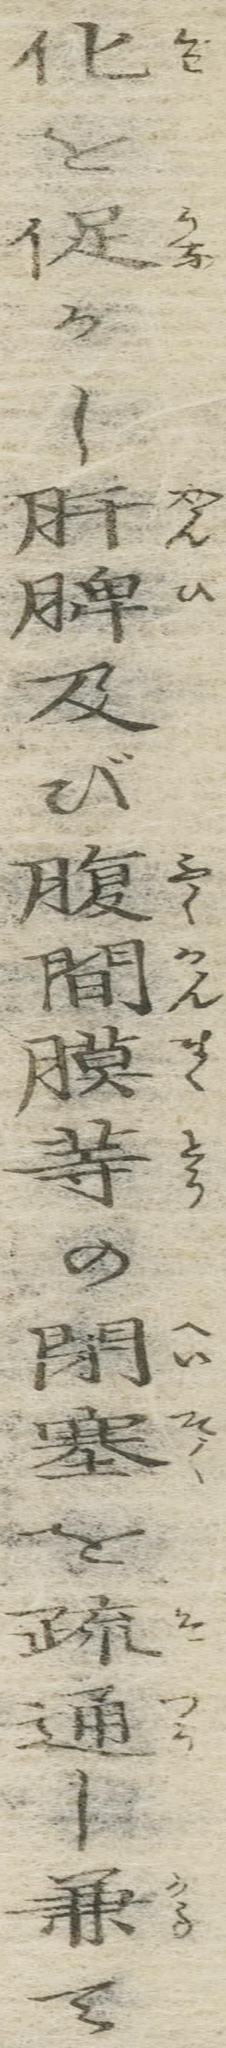化を促かし肝脾及び腹間膜等の閉塞を疏通し兼て

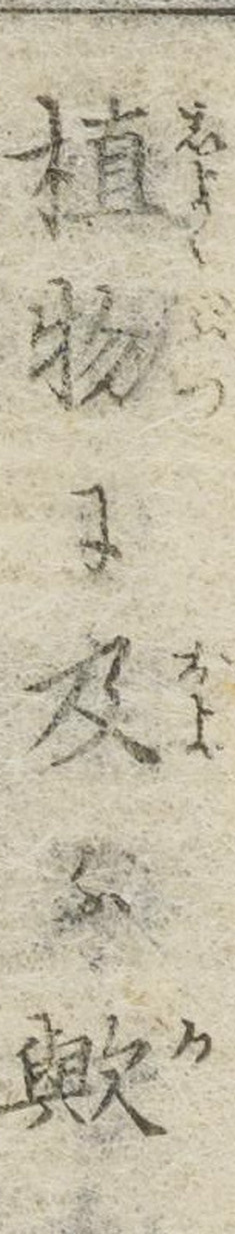植物に及ぶ歟
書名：豆州熱海誌　完
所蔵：東京大学地震研究所図書室 Earthquake Research Institute Library, The University of Tokyo, JAPAN
